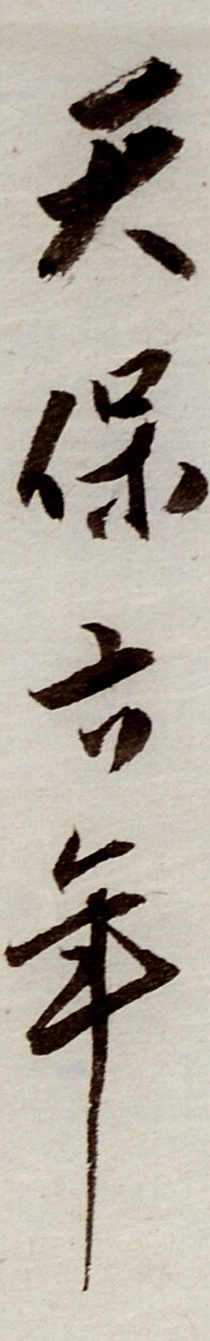天保六年
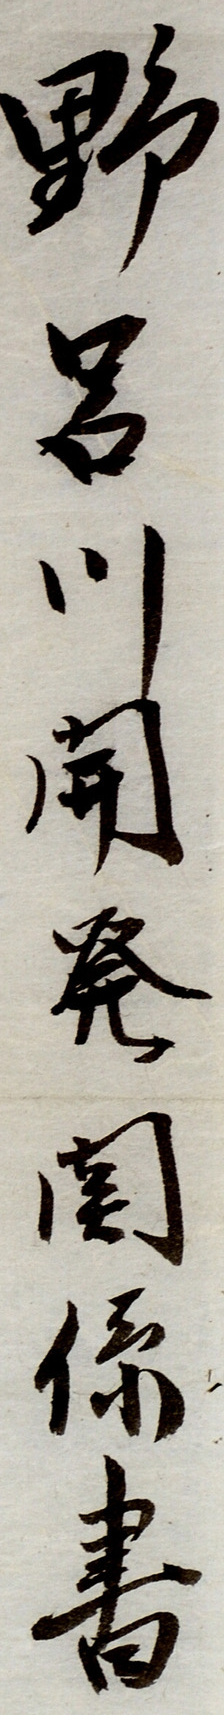野呂川開発関係書

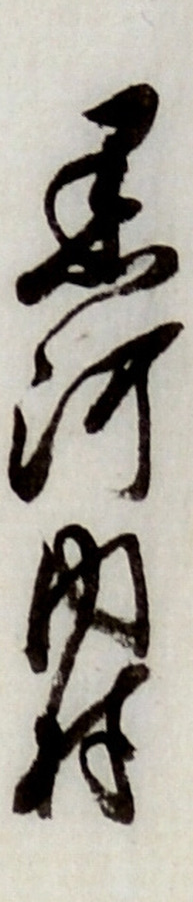黒河内村
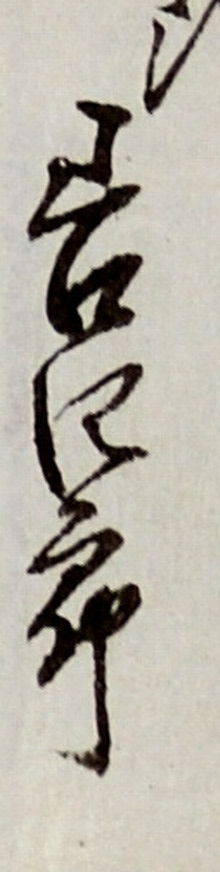善四郎
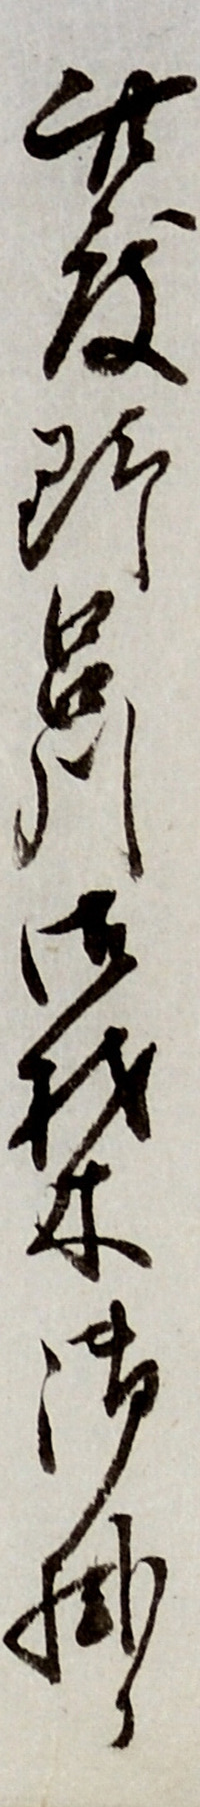此度野呂川御材木御掛り
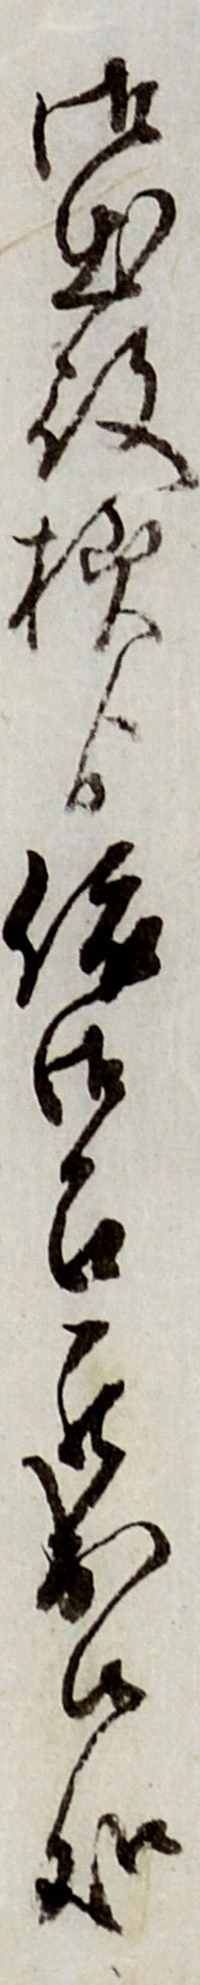御出役様ゟ依御召罷出候処
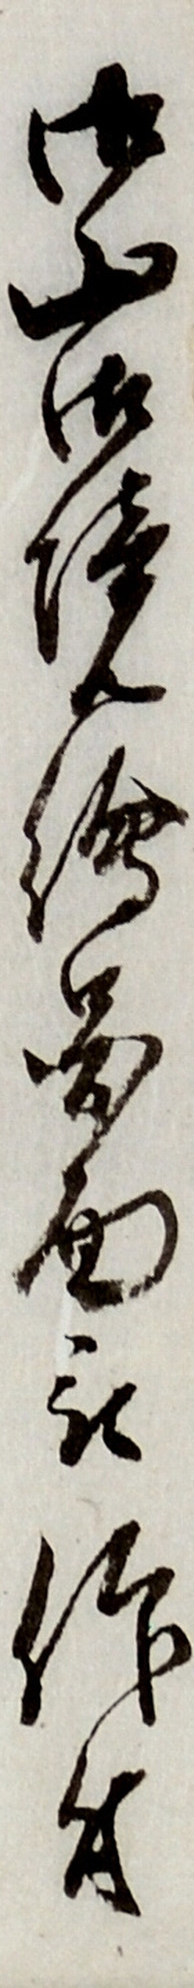御山御境絵図面被仰付
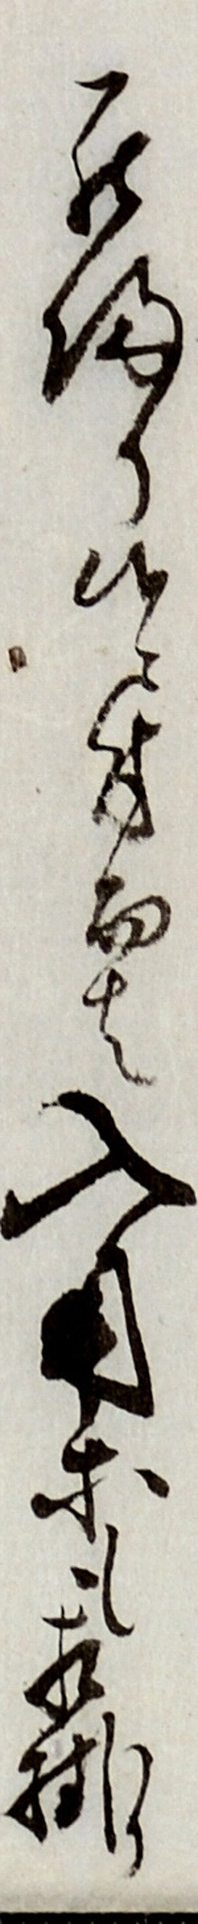罷帰り候ニ付而者入用等も相掛り
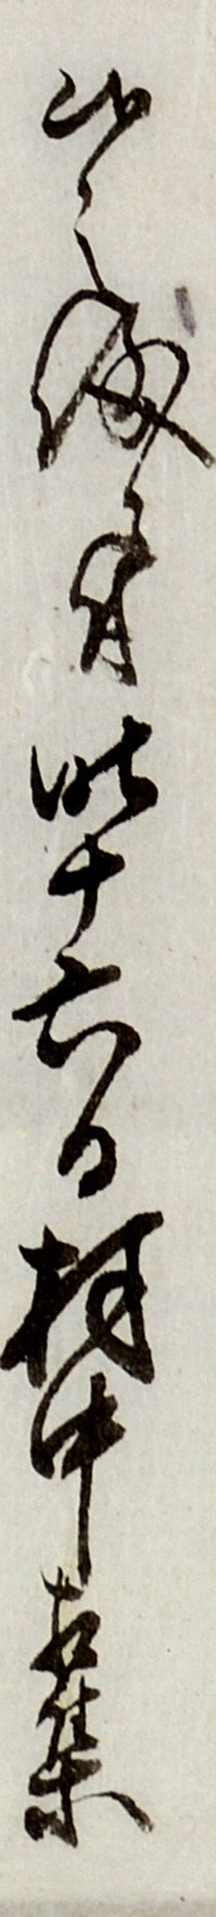候之儀ニ付昨十六日村中相集
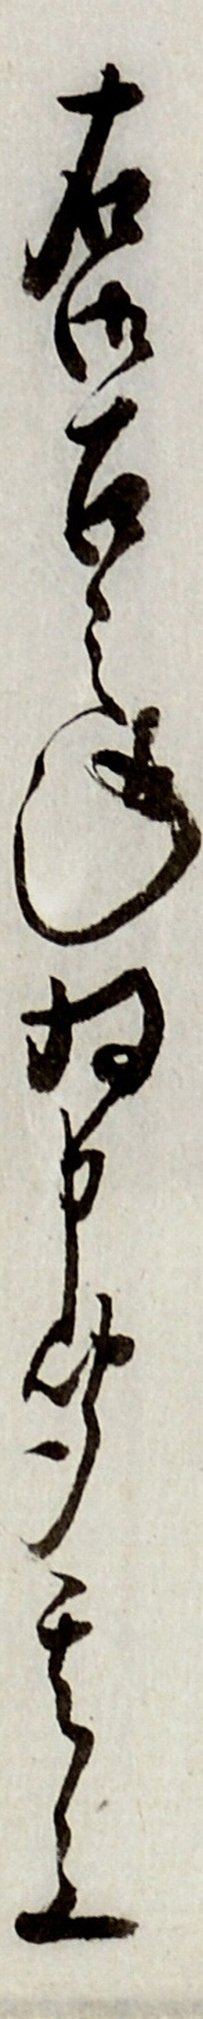右御召之趣為申聞其上
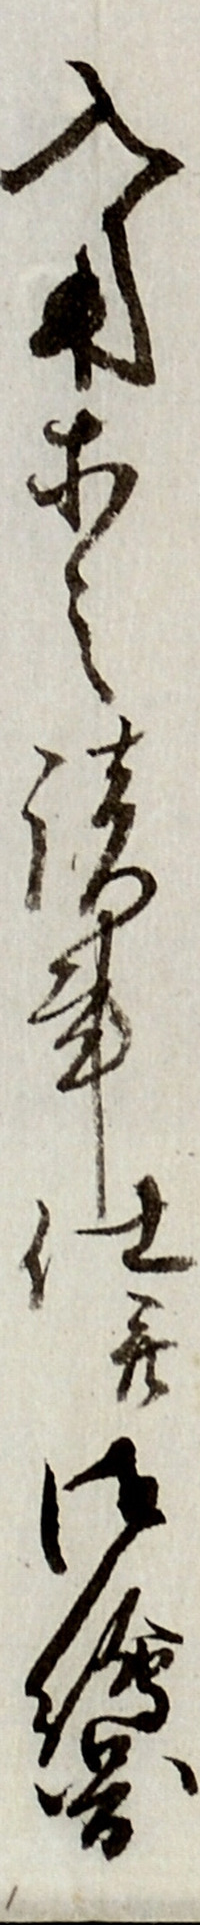入用等之談事仕幷御絵図
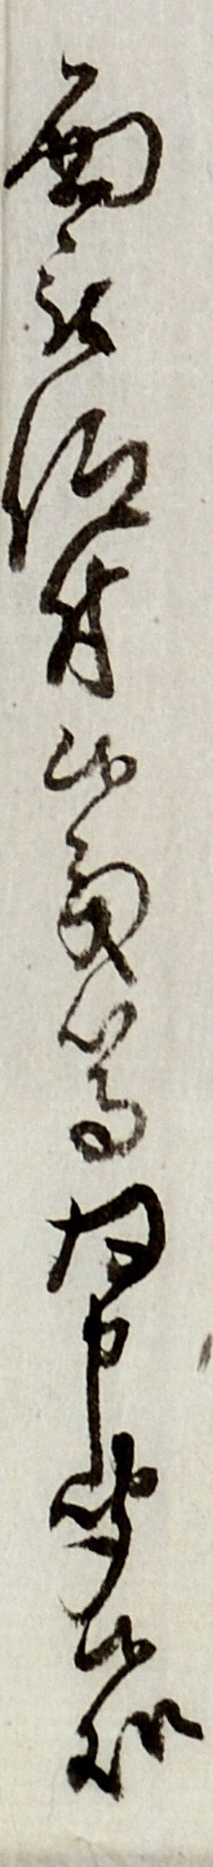面被仰付候義等為申聞候処
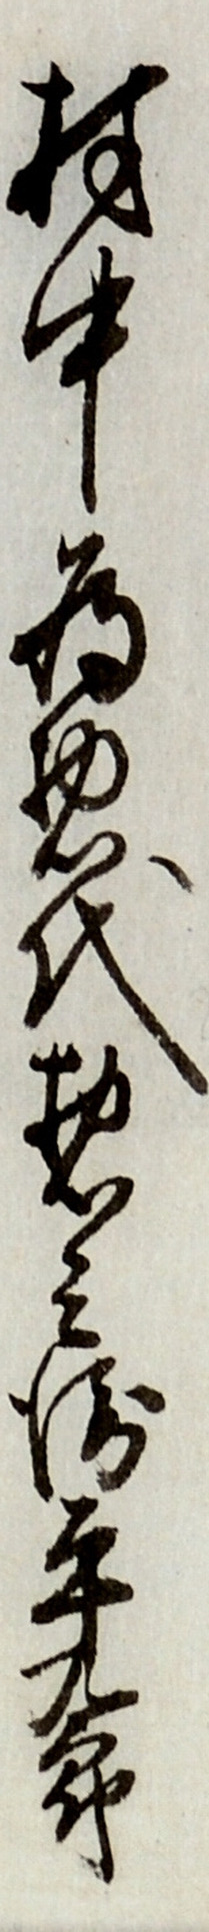村中為惣代惣兵衛平九郎
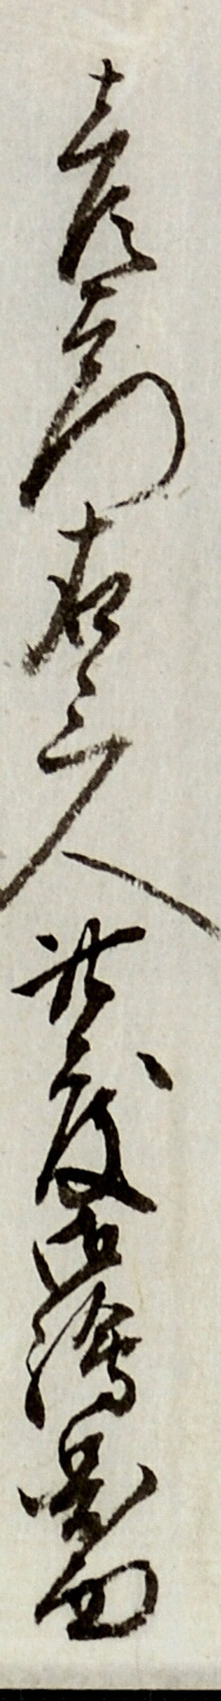彦右衛門右三人此度御絵図面
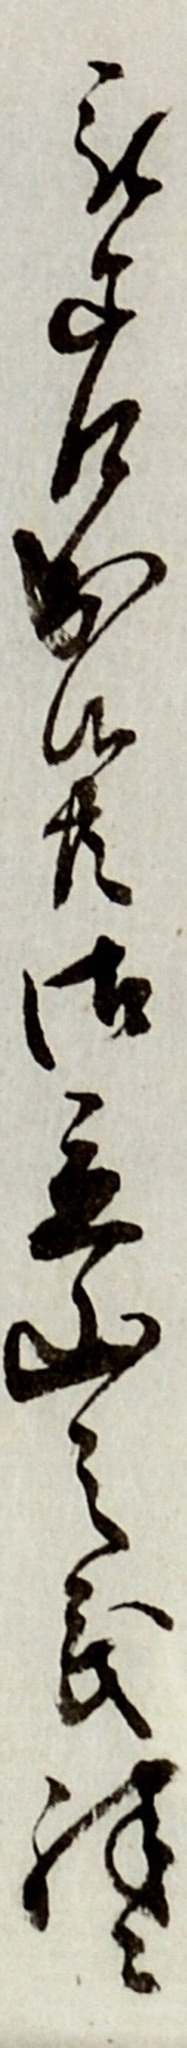被差出候共御立山之義殊ニ
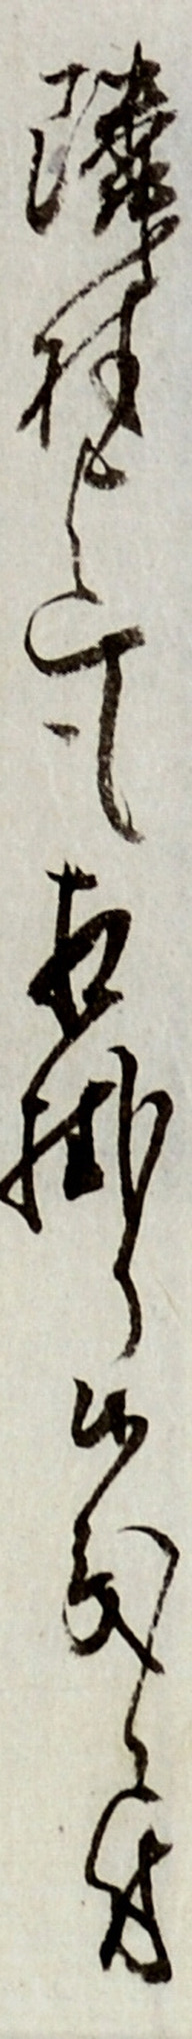隣村迄も相掛り候義ニ付
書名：野呂川開発関係書
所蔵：伊那市立高遠町図書館・合同会社AMANE
